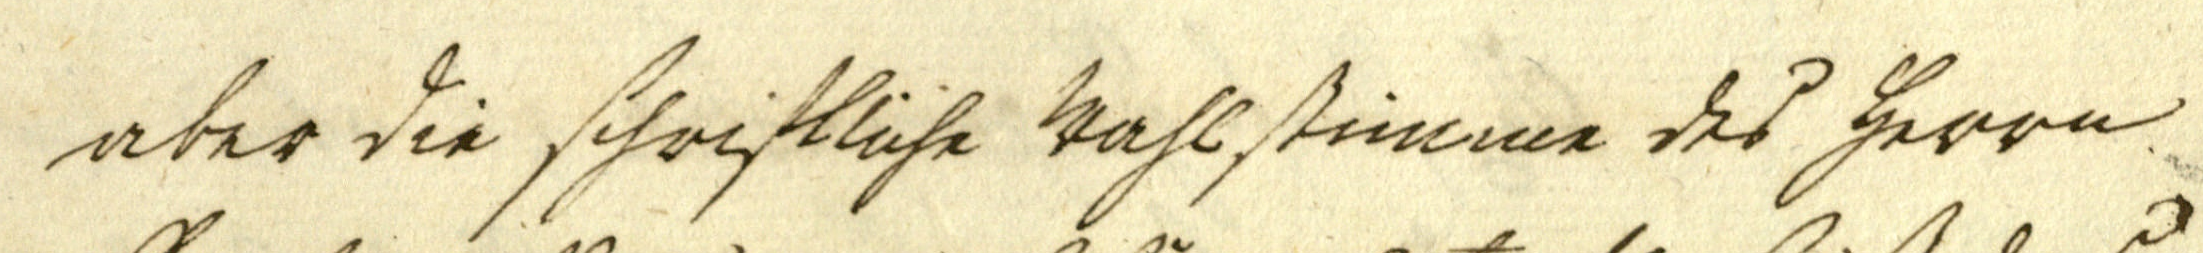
aber die schriftliche Wahl stimme des Herrn
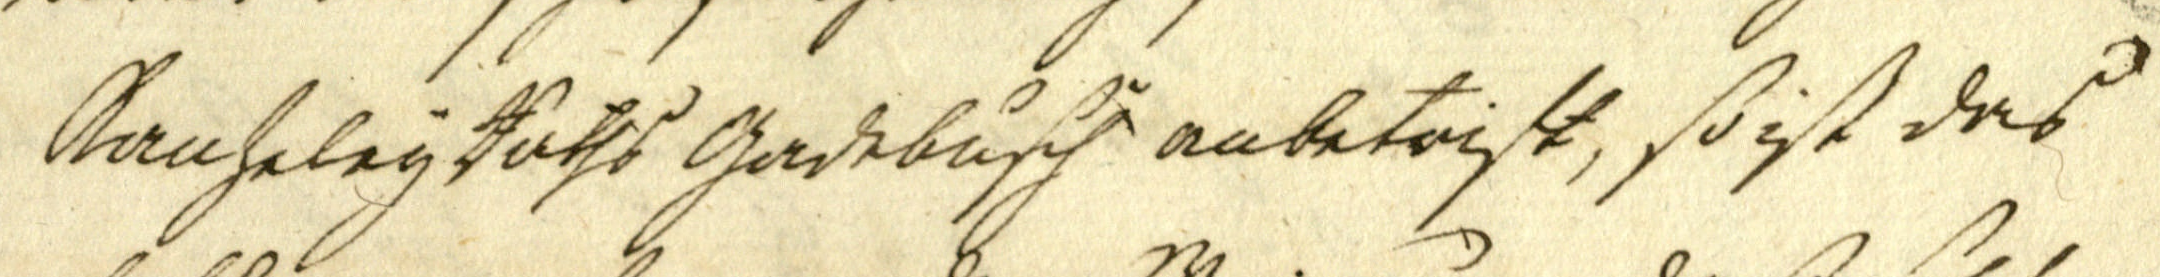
Kanzeleÿ Raths Gadebusch anbetrift, so ist das
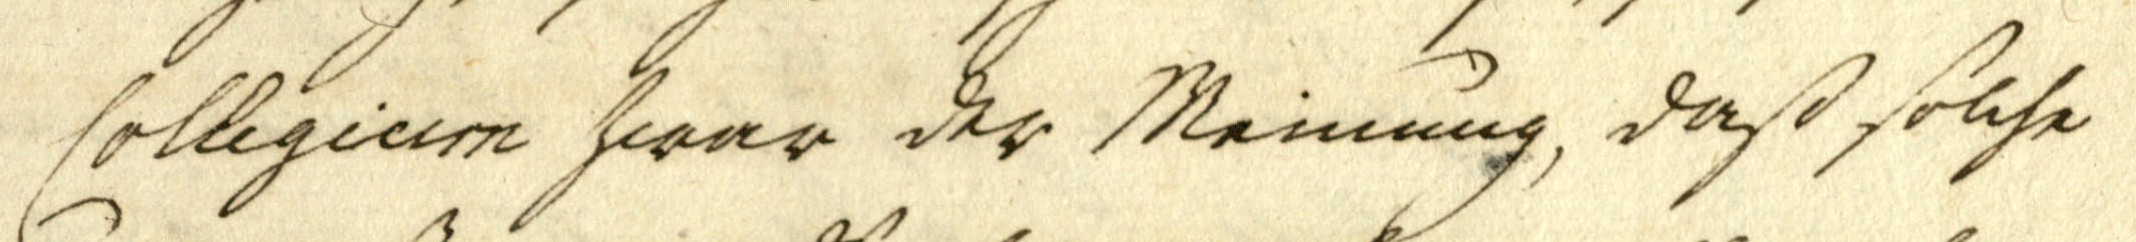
Collegium zwar der Meinung, daß solche
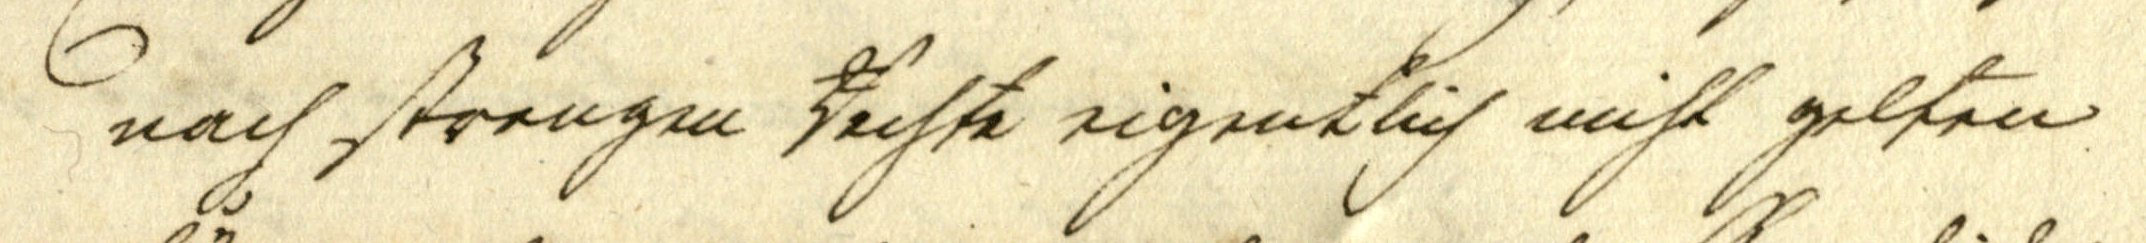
nach strengen Rechte eigentlich nicht gelten
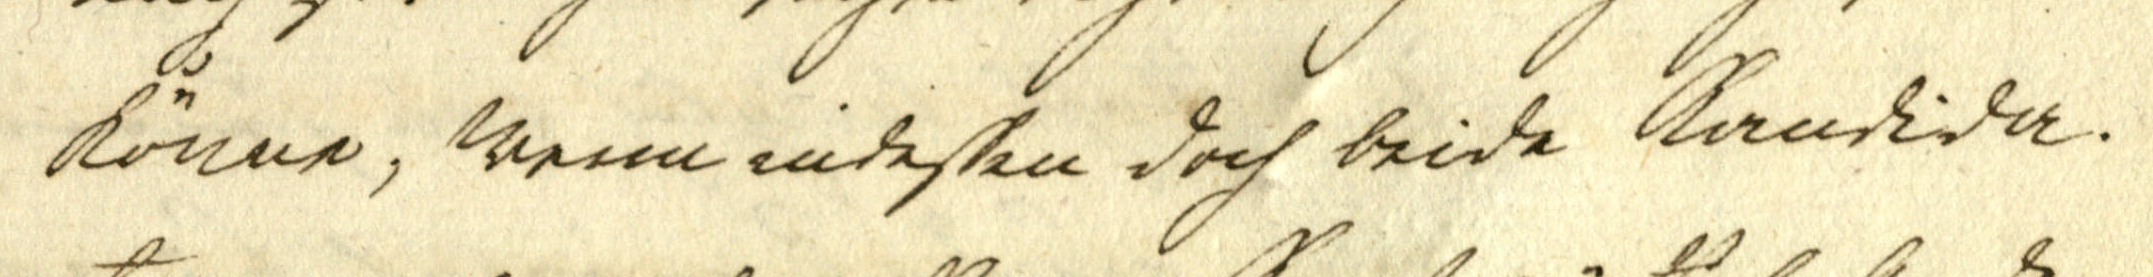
könne, wenn indessen doch beide Kandida¬
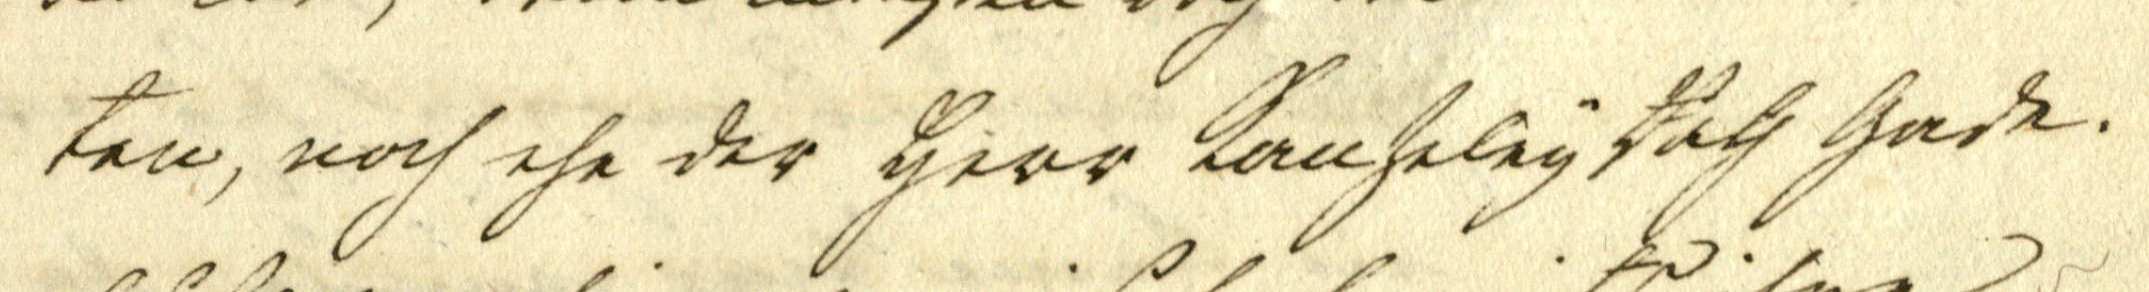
ten, noch ehe der Herr Kanzeleÿ Rath Gade¬
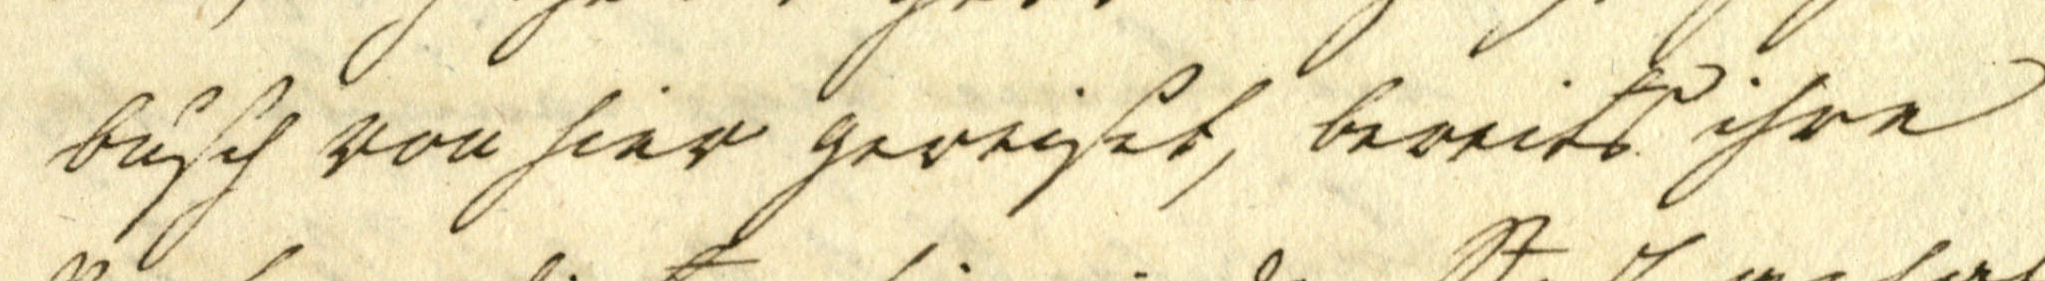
busch von hier gereiset, bereits ihre
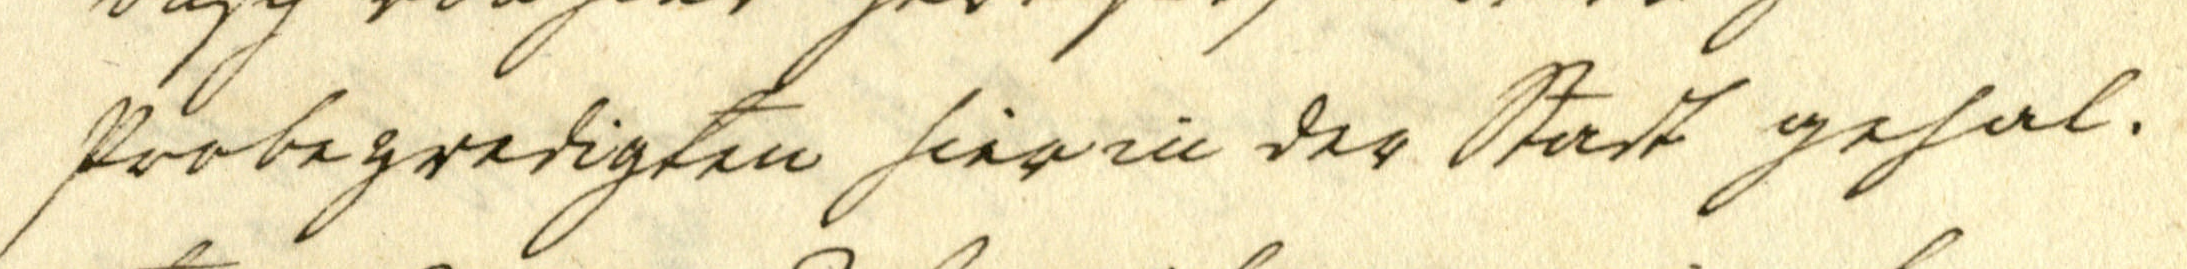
Probepredigten hier in der Stadt gehal¬
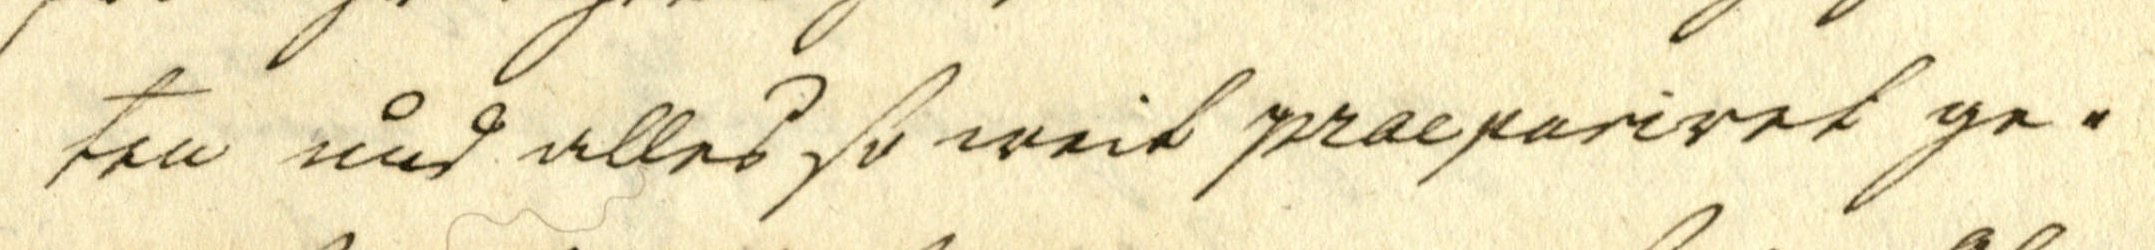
ten und alles so weit praepariret ge¬
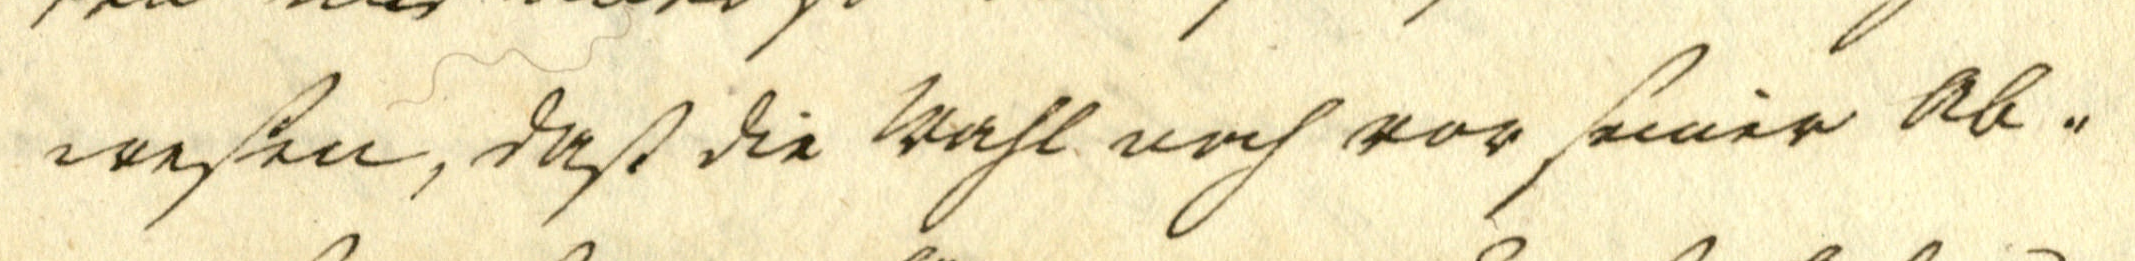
wesen, daß die Wahl noch vor einer Ab¬
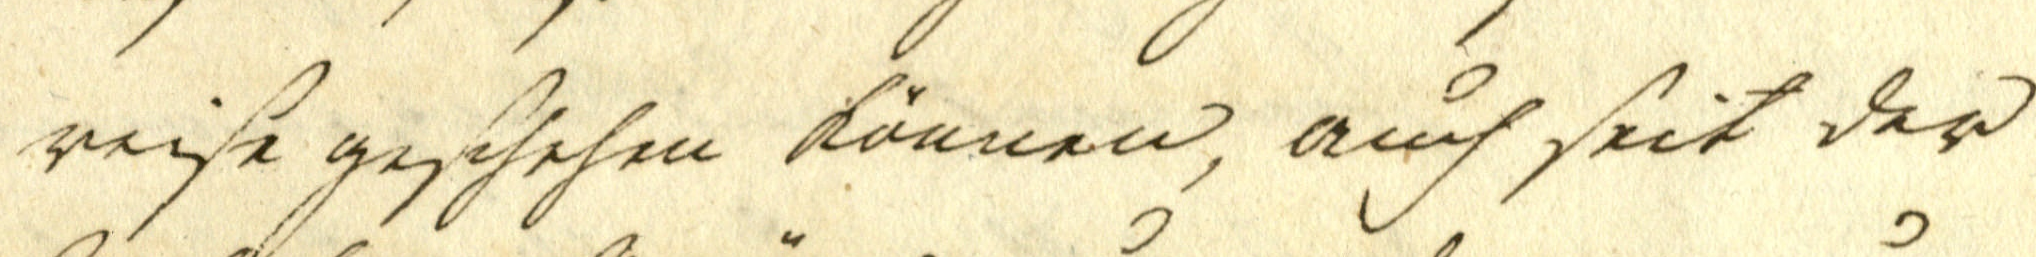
reise geschehen können, auch seit der
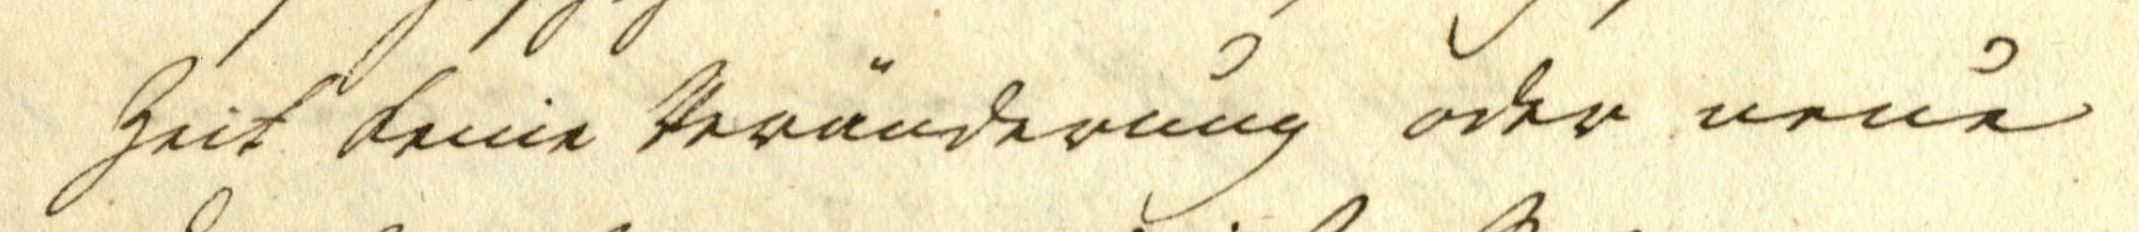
Zeit keine Veränderung oder neue
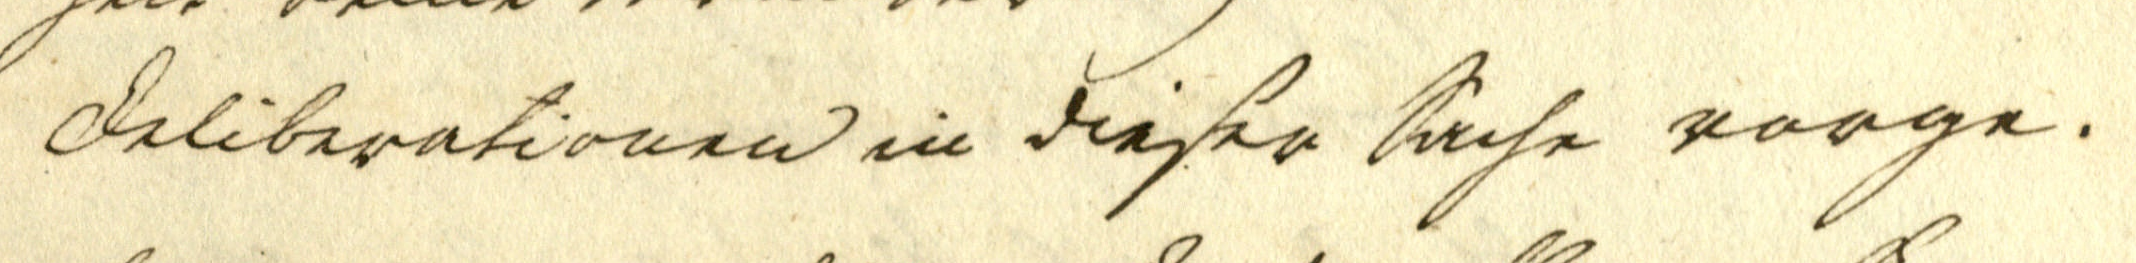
Deliberationen in dieser Sache vorge¬
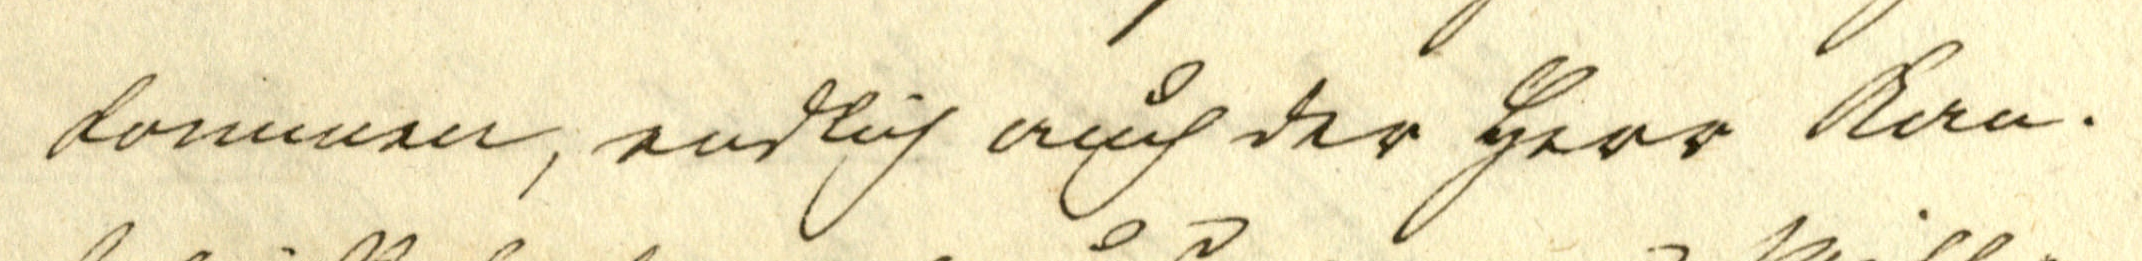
kommen, endlich auch der Herr Kan¬
